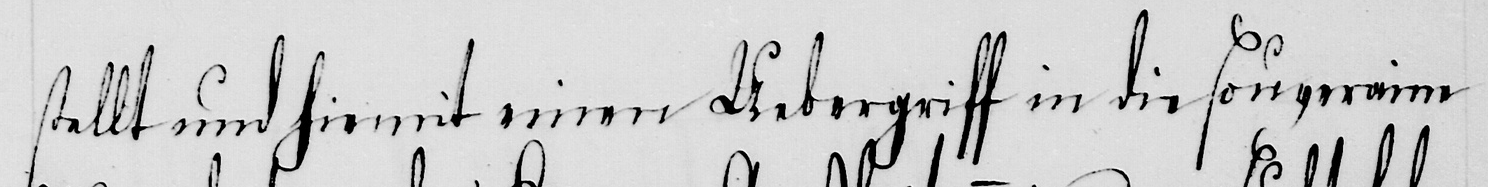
tellt und hiemit einen Uebergriff in die souveraine
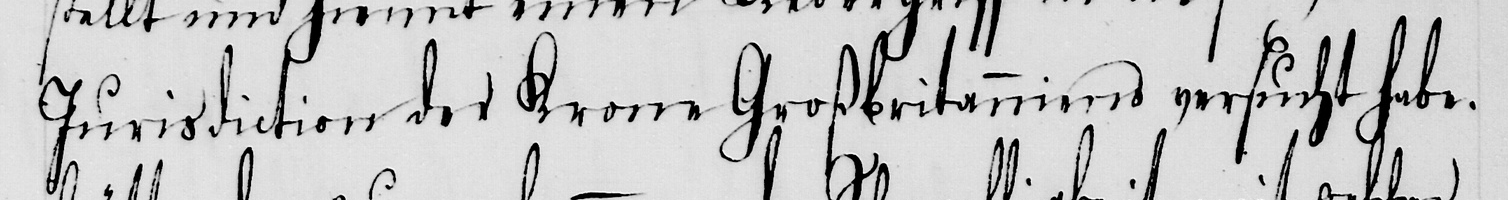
Jurisdiction der Krone Großbritanniens versucht habe.
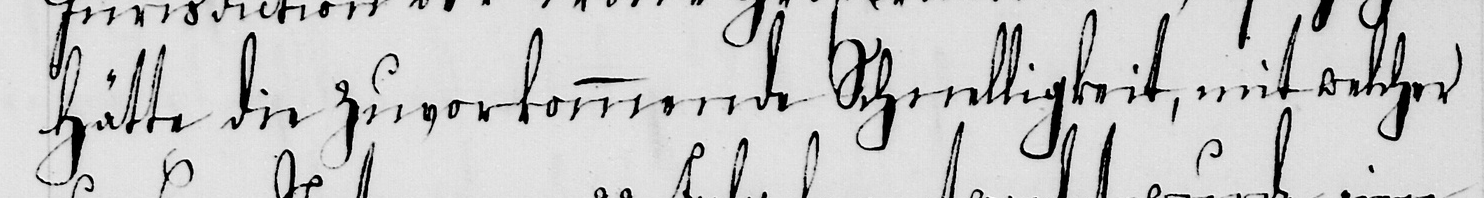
Hätte die zuvorkommende Schnelligkeit, mit welcher
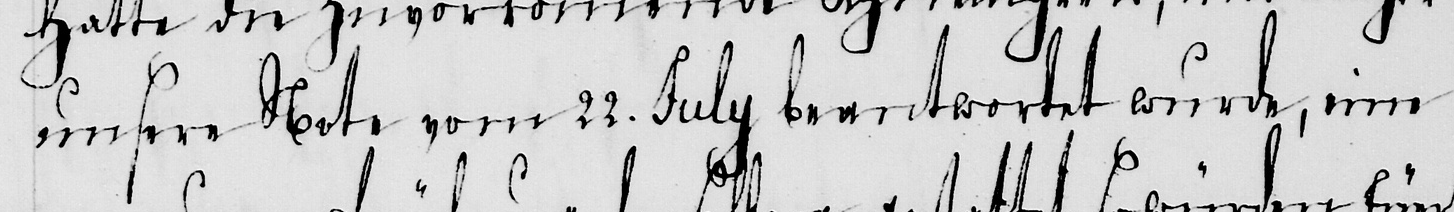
unsere Note vom 22. July beantwortet wurde, eine
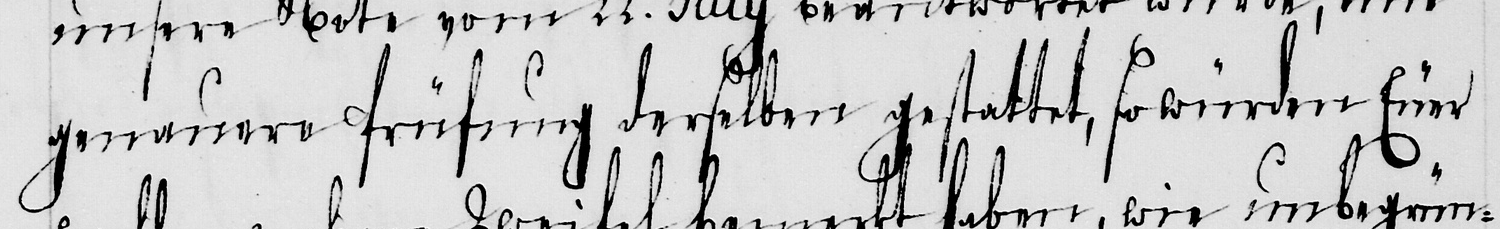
genauere Prüfung derselben gestattet, so würden Euer
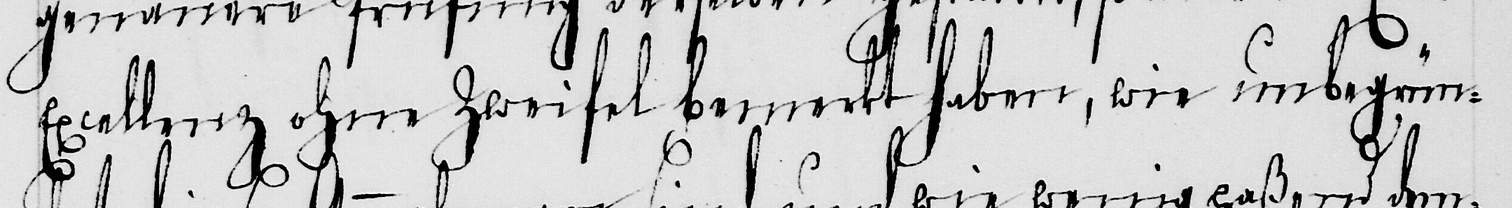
Excellenz ohne Zweifel bemerkt haben, wie unbegrün¬
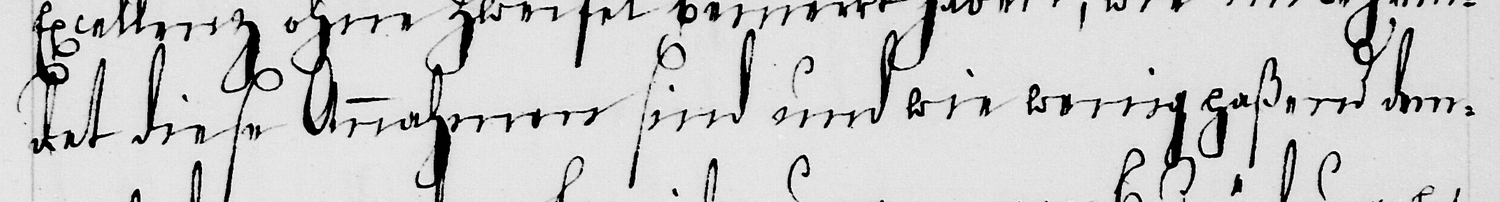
det diese Annahmen sind und wie wenigpaßend dem¬
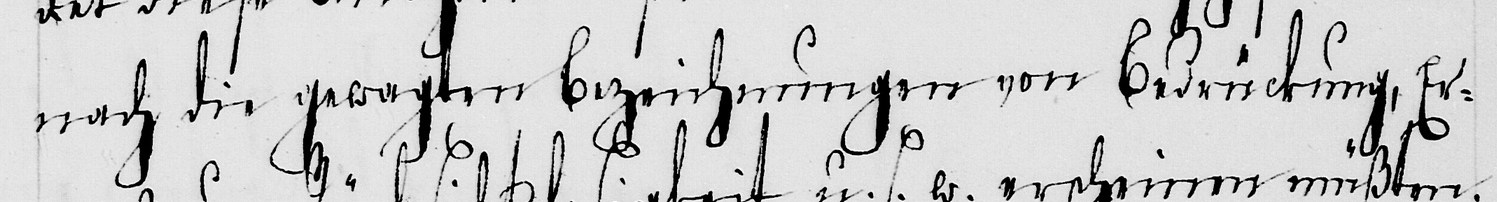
nach die gewagten Bezeichnungen von Bedrückung, Er¬
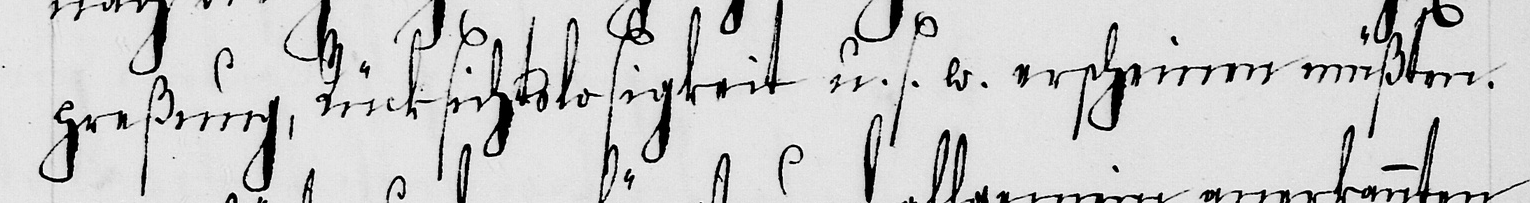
preßung, Rücksichtslosigkeit u. s. w. erscheinen müßten.
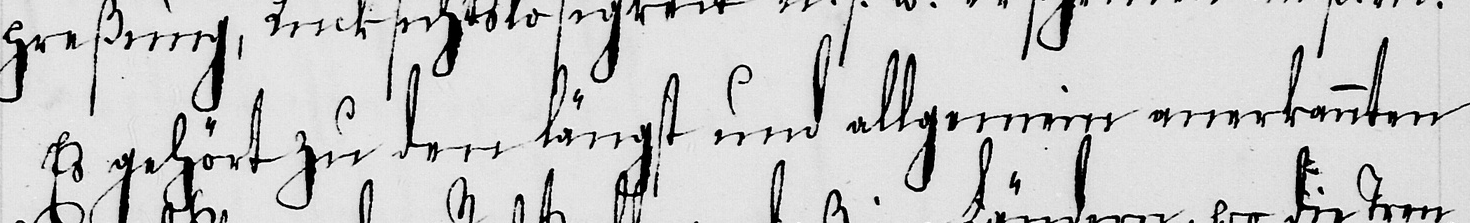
Es gehört zu den längst und allgemein anerkannten
